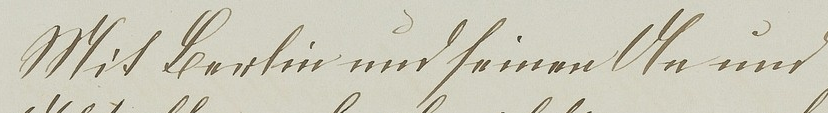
Mit Berlin und seinen An und
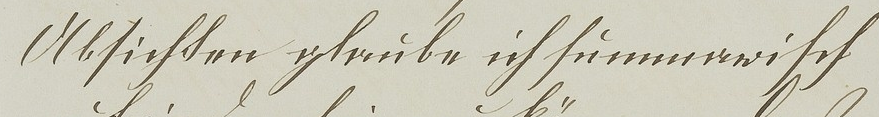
Absichten glaube ich summarisch
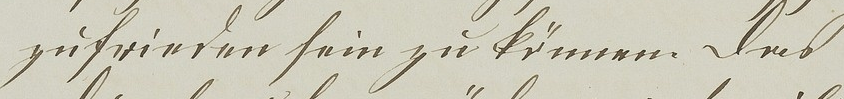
zufrieden sein zu können. Das
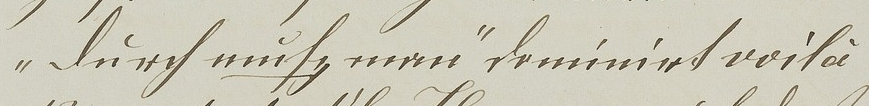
«durch musz man» dominirt voilà
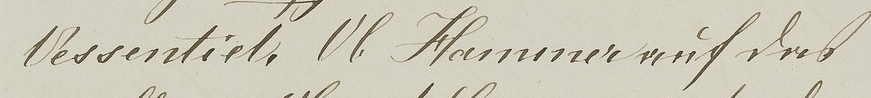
l'essentiel. Ob Hammer auf das
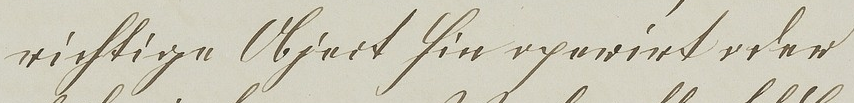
richtige Object hin operirt oder
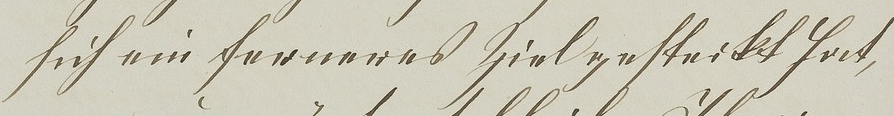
sich ein ferneres Ziel gesteckt hat,
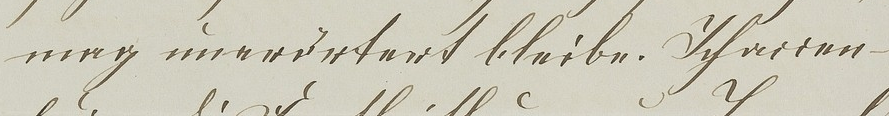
mag unerörtert bleibe. Ich accen-
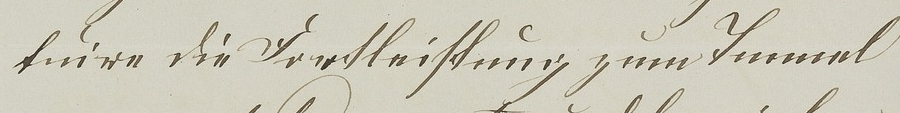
tuire die Fortleistung zum Tunnel
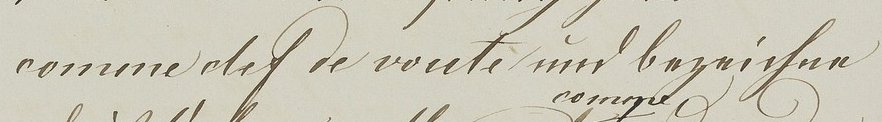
comme clef de voute und bezeichne
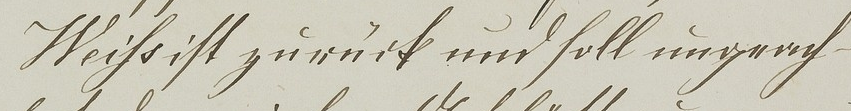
Weiss ist zurück und soll ungeach-
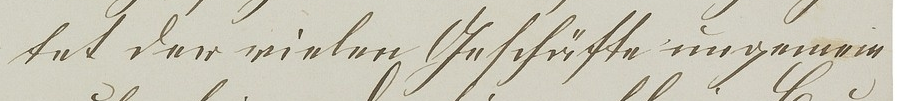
tet der vielen Geschäfte ungemein
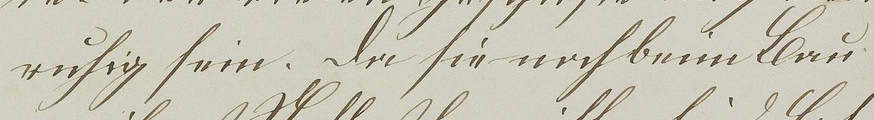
ruhig sein. Da sie noch beim Bau-
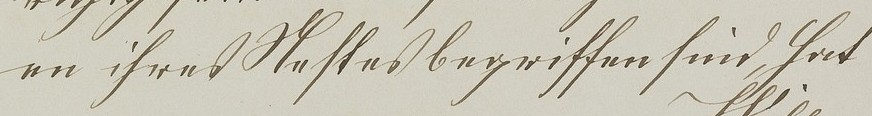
en ihres Nestes begriffen sind, hat
